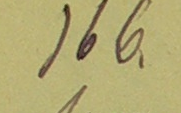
166
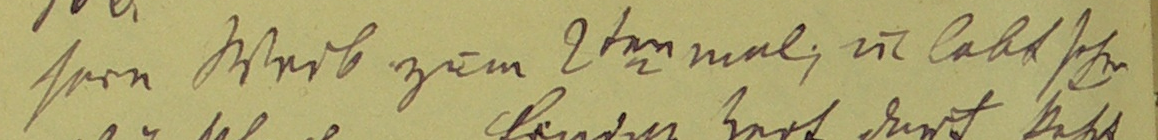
sein Weib zum 2-ten mal, und lebt sehr
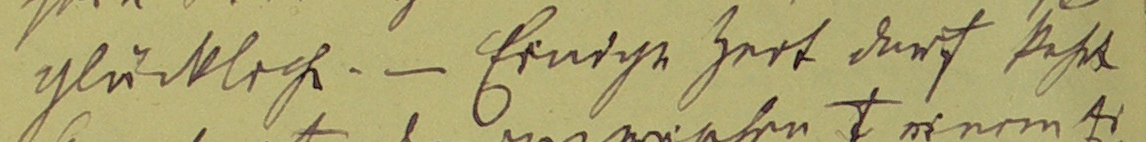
glücklich.—Einige Zeit darauf kehrte
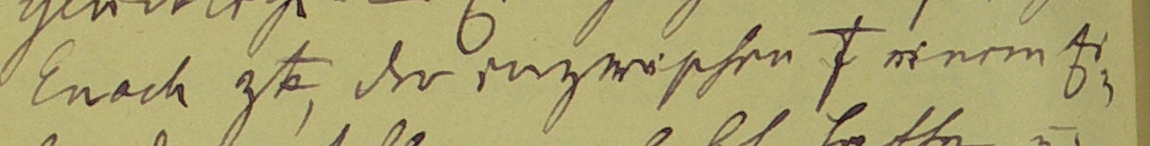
Enoch zurück , der inzwischen auf einem Ei¬
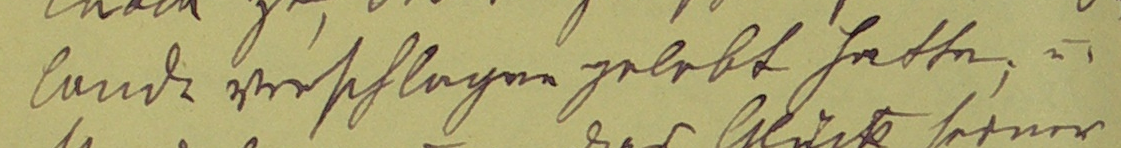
land verschlagen gelebt hatte , und
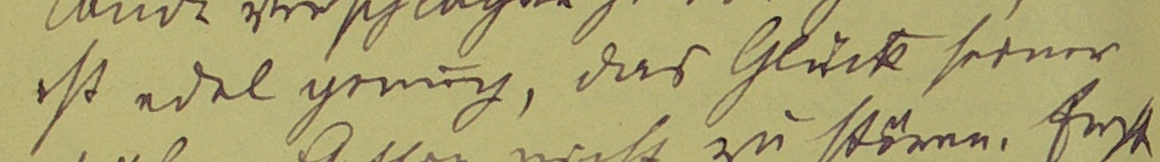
ist edel genug , das Glück seiner
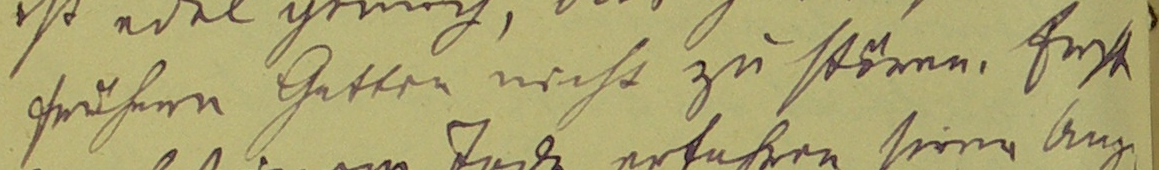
früheren Gattin nicht zu stören. Erst
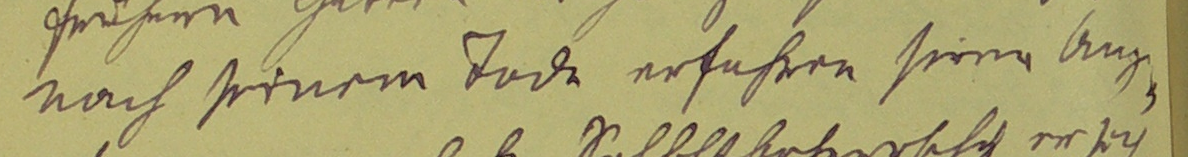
nach seinem Tode erfahren seine Ang¬
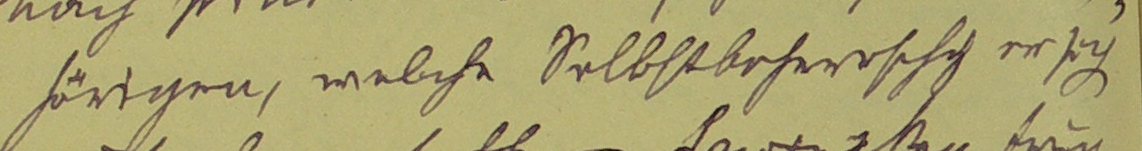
ehörigen welche Selbstbeherrschung er sich
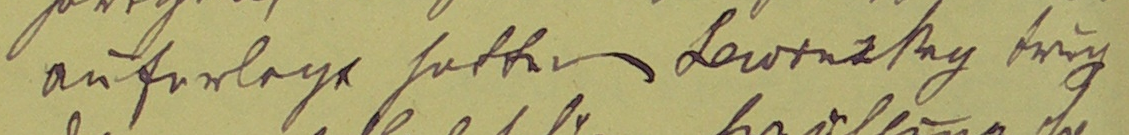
auferlegt hatte .—Lewinsky trug
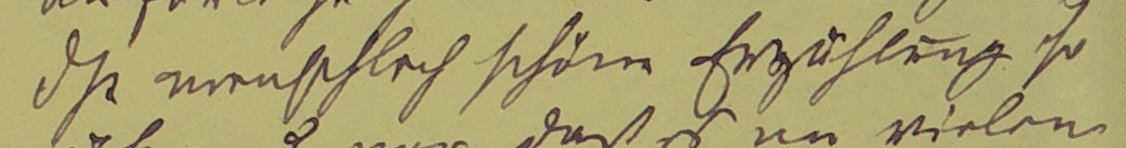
diese menschlich schöne Erzählung so
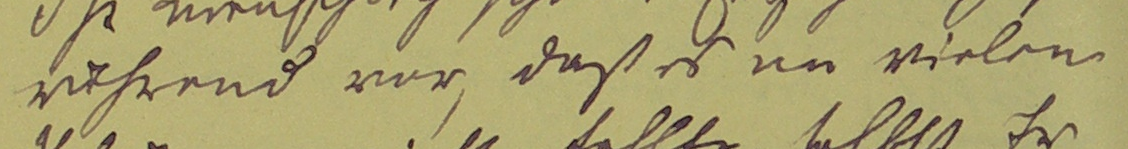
rührend vor , daß es an vielen
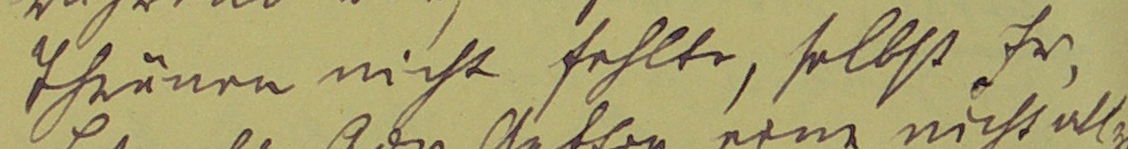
Thränen nicht fehlte , selbst Fr.
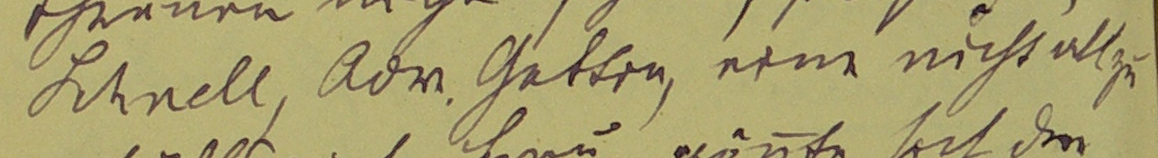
Schnell, Adv. Gatten, eine nicht allzu
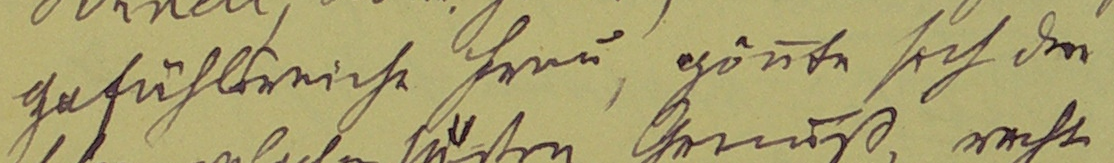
gefühlsreiche Frau , gönnte sich den
